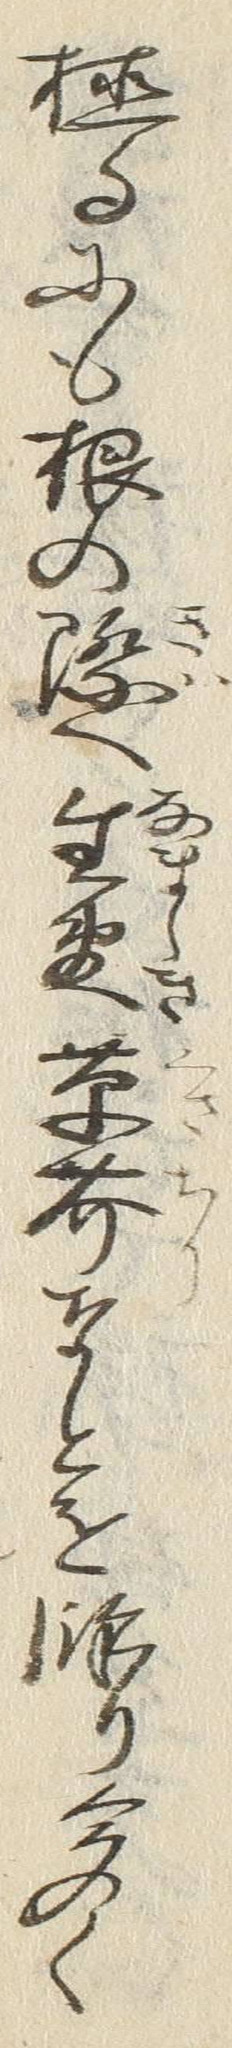植る尓も根の際へ生敷草芥なとを餘り多く
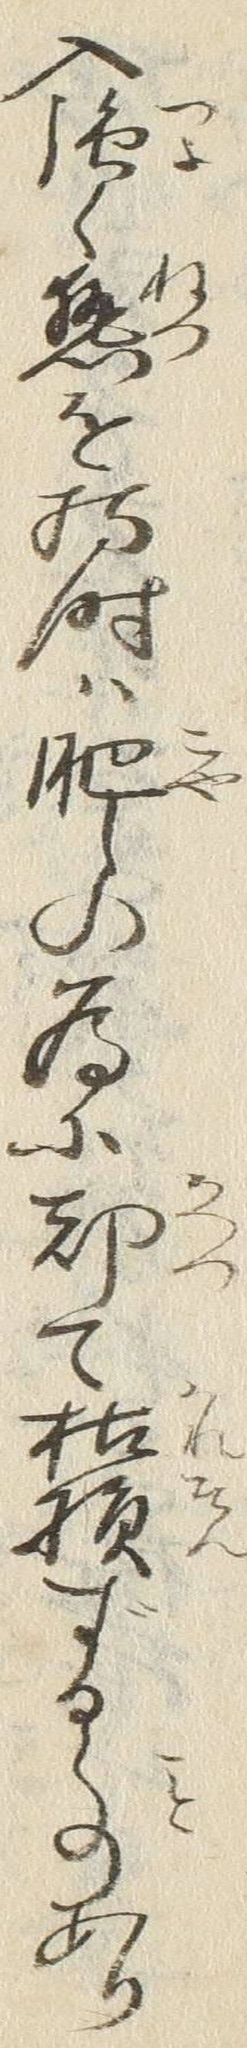入強く熱を持時は肥しの為尓却て枯損ずる事あり
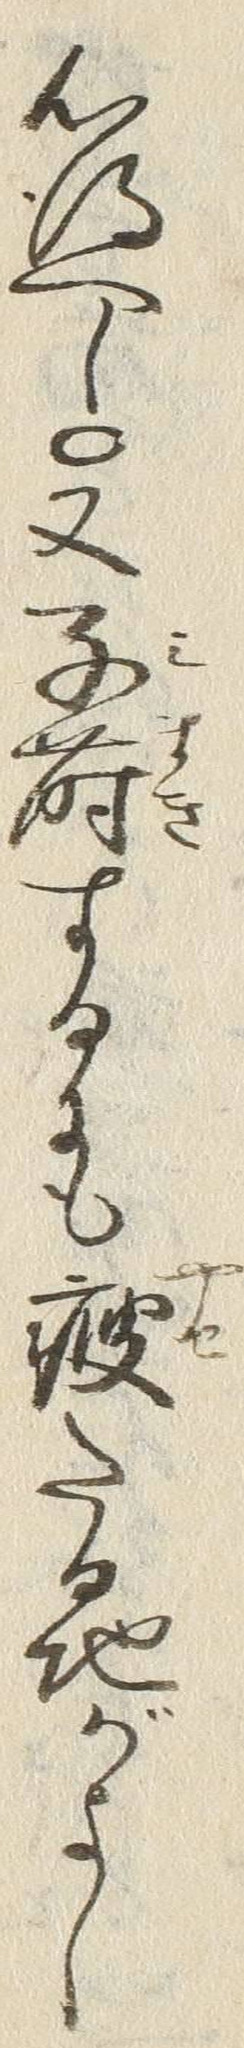心得へし〇又子蒔する尓も痩たる地がよし
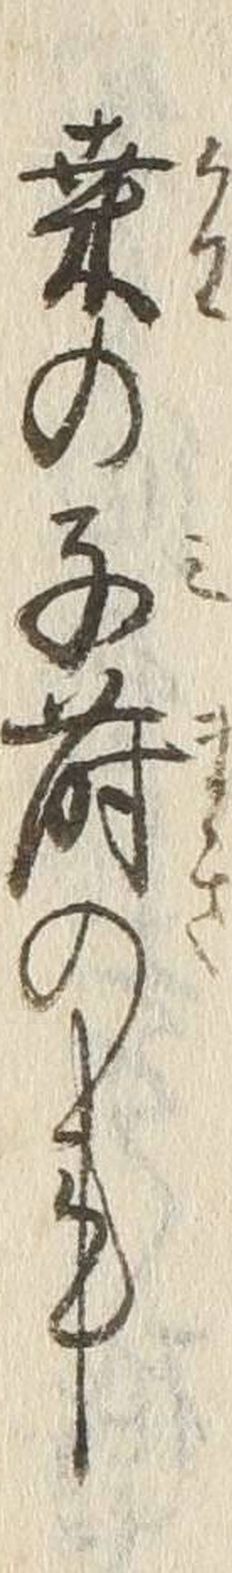桑の子蒔の事
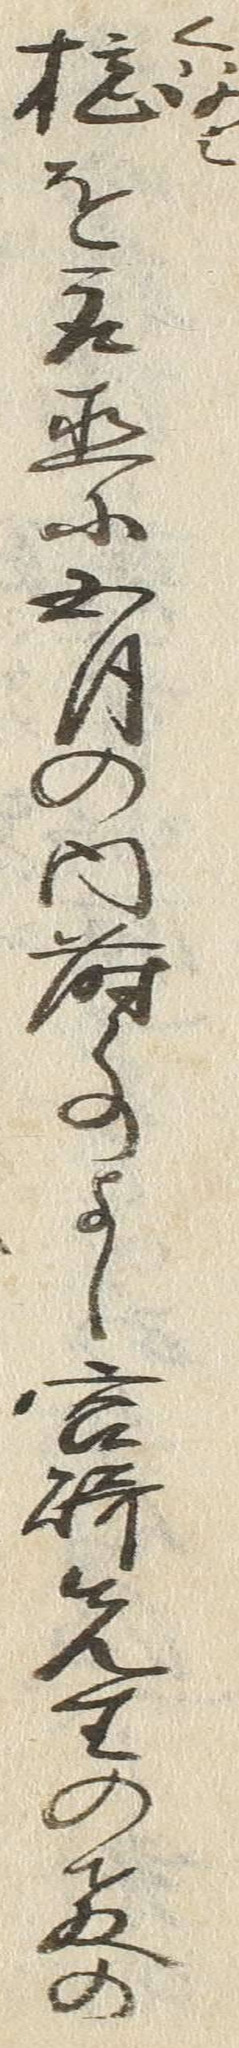椹を取置尓五月の内蒔事よし宮崎先生の教の
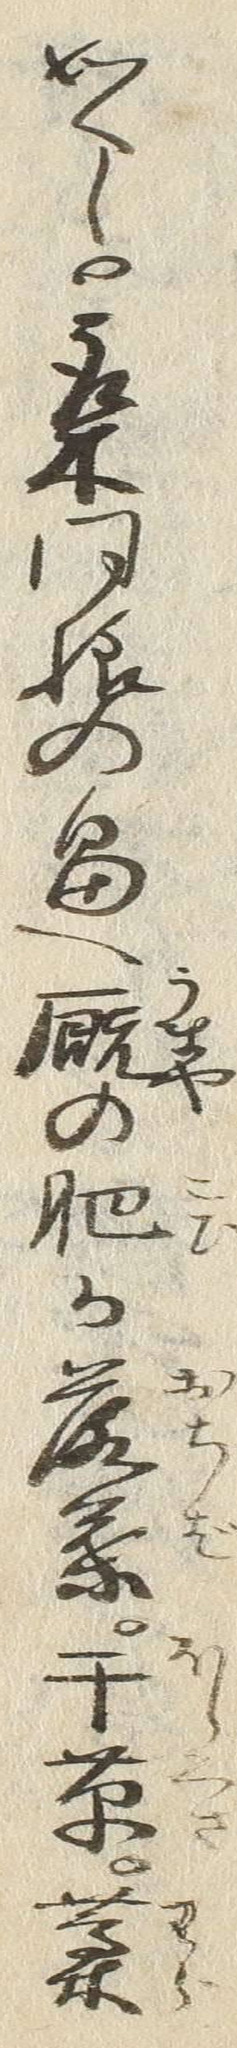如くし〇取木同様の畠へ厩の肥か落葉。干草。藁
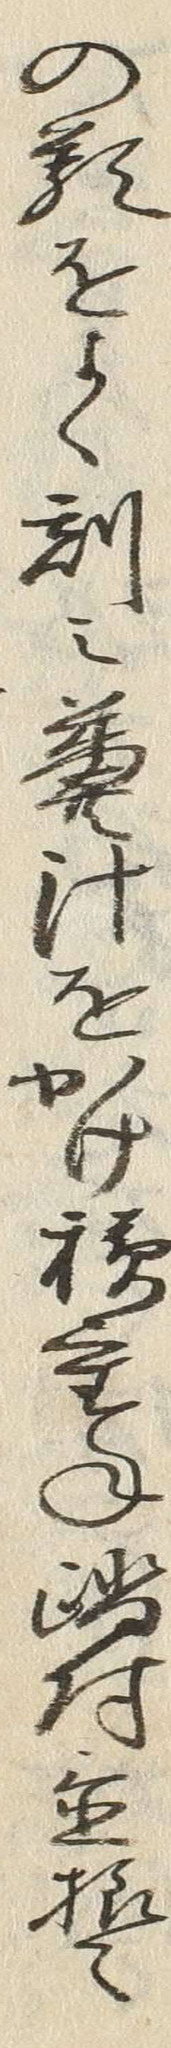の類をよく刻み糞汁をかけ積重年踏付置様々
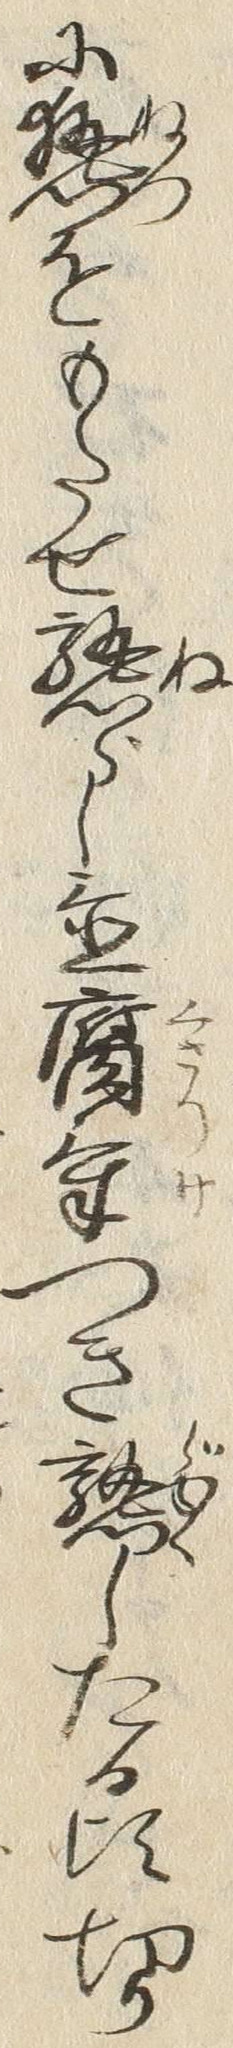尓熱をもたせ熟らし置腐気つき熟したる頃切り
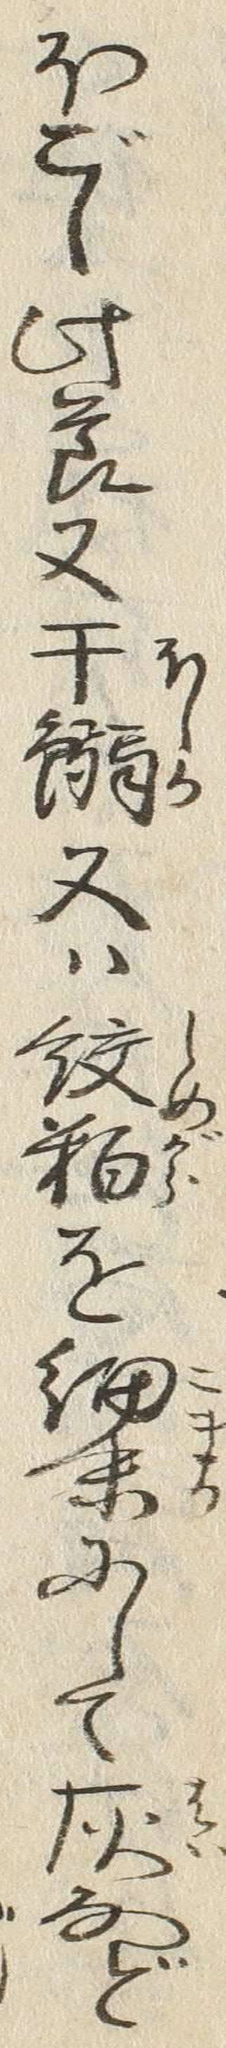不ごし此節又干鰯又は絞粕を細末尓して灰など
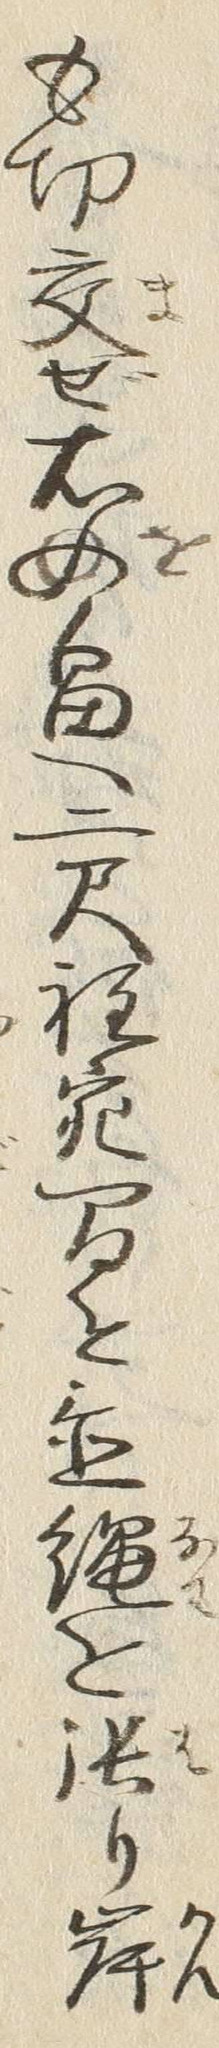も切交ぜ右を畠へ二尺程宛間を置縄を張り岸
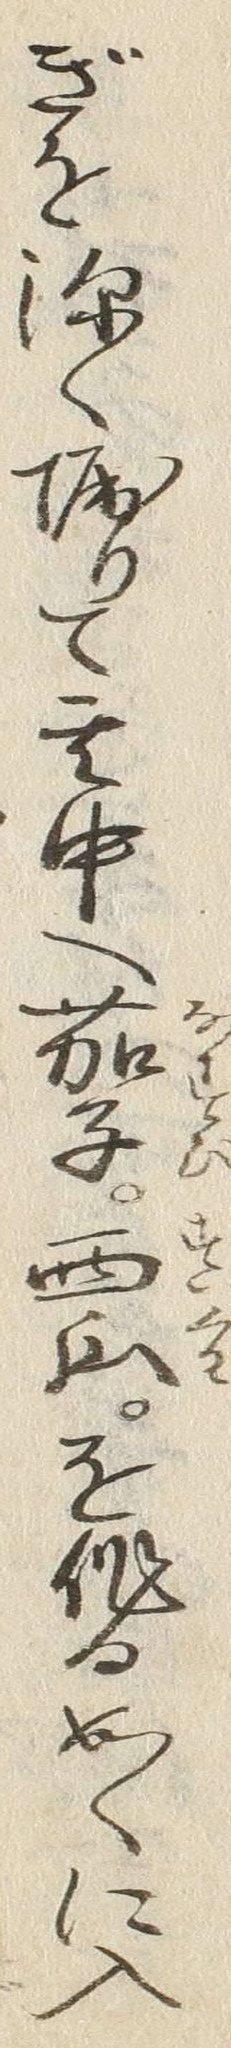ぎを深く堀りて其中へ茄子。西瓜。を作る如くに入
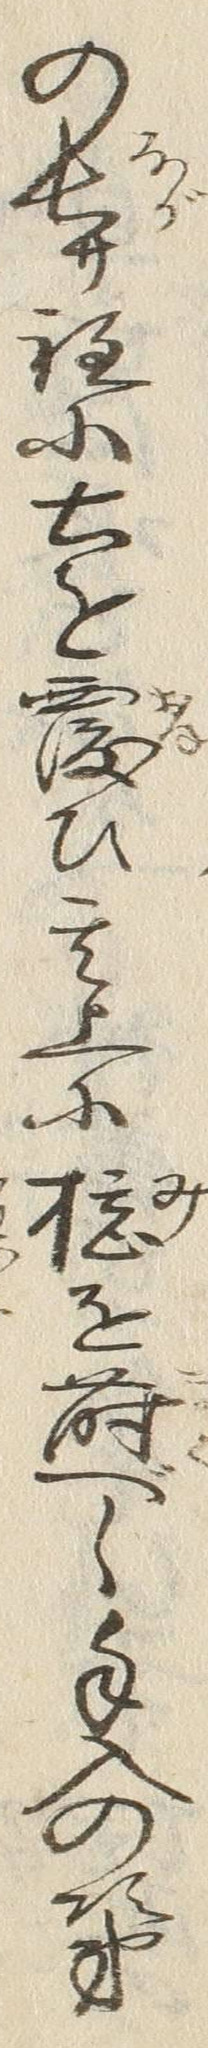の長サ程尓土を覆ひ其上尓椹を蒔べし手入の次第
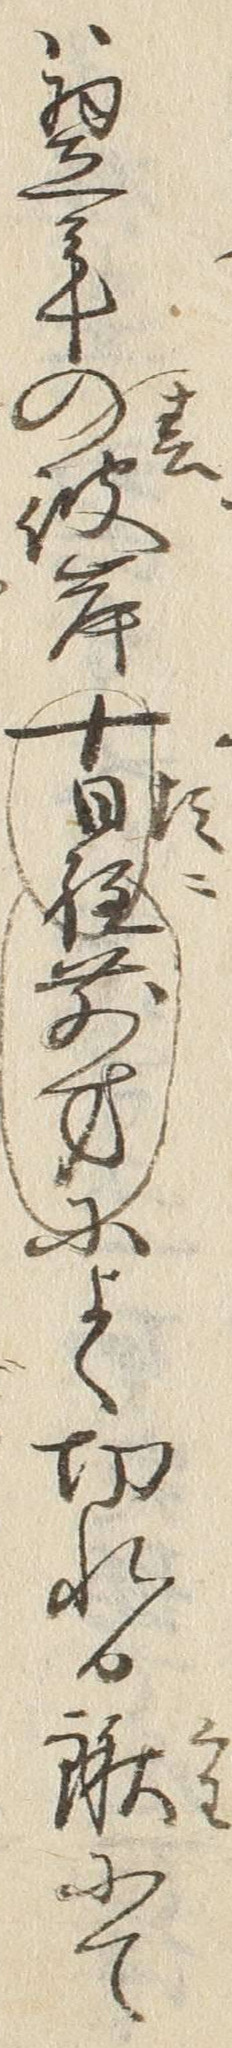は翌年の春彼岸頃尓よく切れる鍬尓て
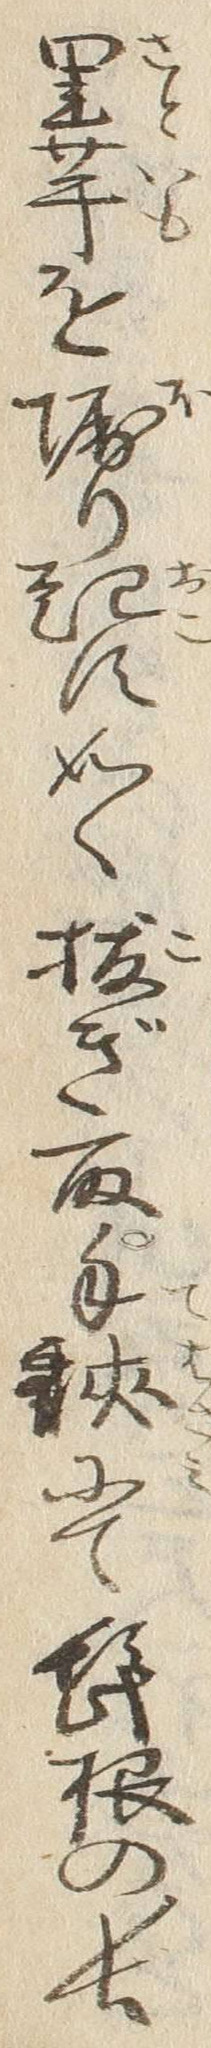里芋を堀り起須如く抜ぎ取。手鋏尓て髭根の長

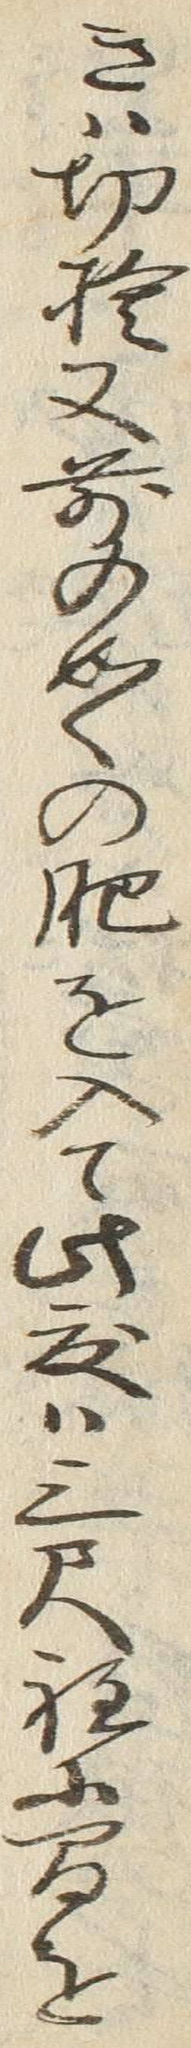きは切捨又前の如くの肥を入て此度は三尺程尓間を
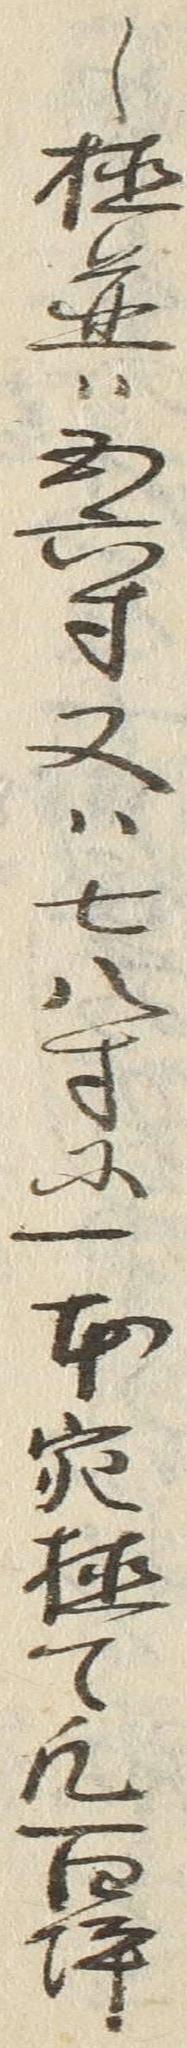し植並は五六寸又は七八寸尓一本宛植て凡百坪
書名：養蠶實驗録後編
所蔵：東京大学農学生命科学図書館 国文学研究資料館
